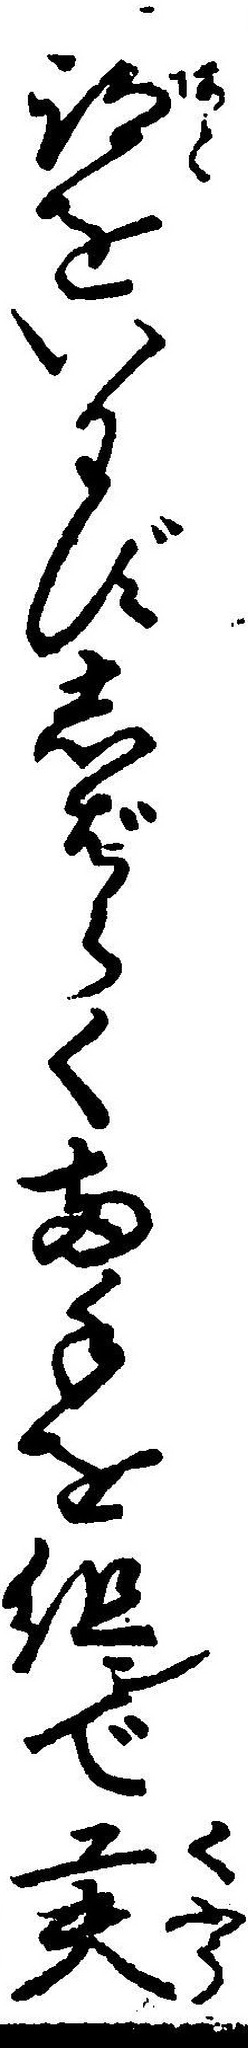跡をいわずしばらく両手を組工夫
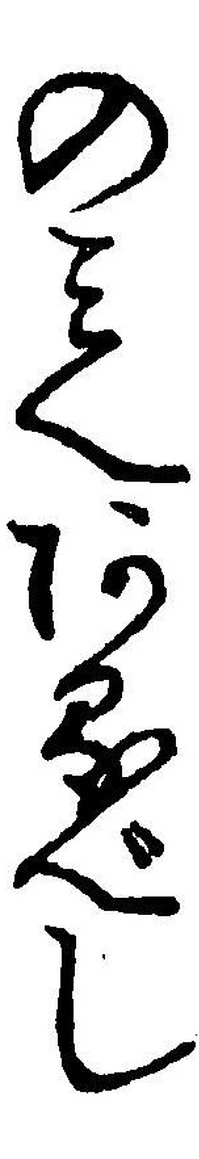のみへあるべし
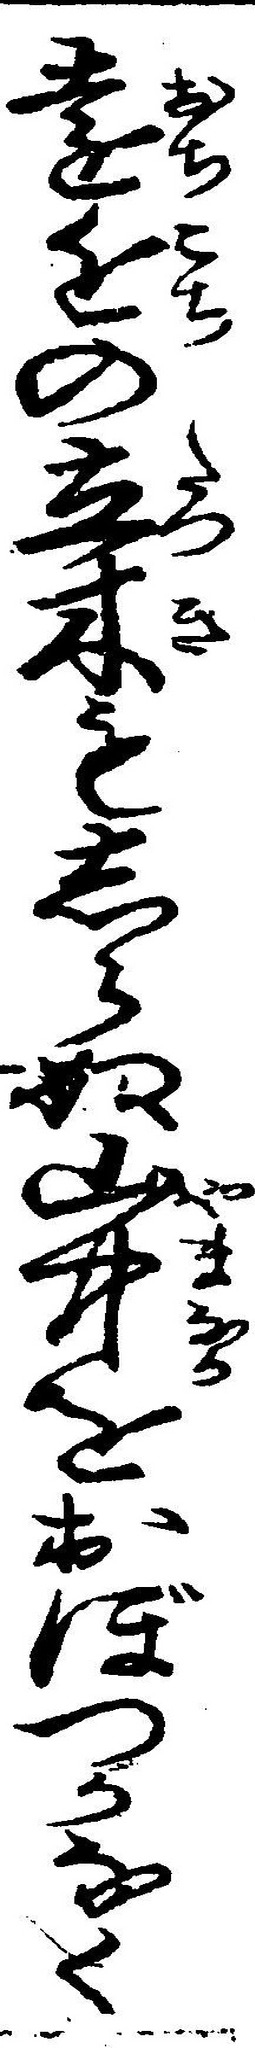遠近の立木もしらぬ山中をおぼつかなく
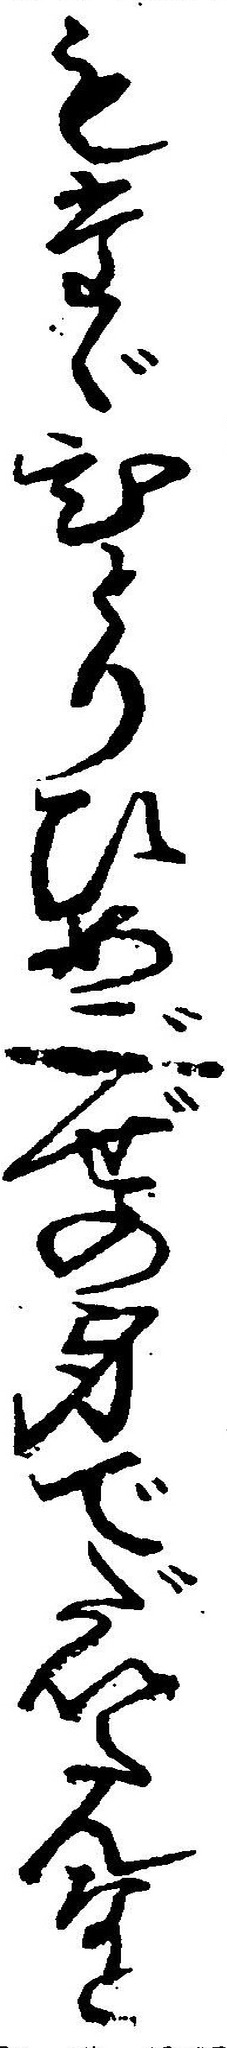もたゞひとりひめごぜの身でだいたんなと
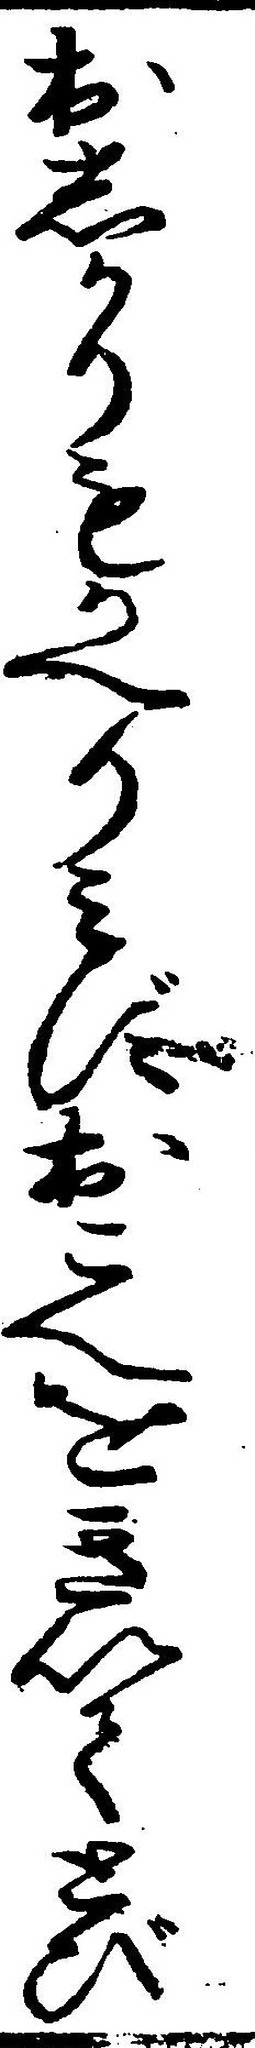おしかりもかへりみずおこへをきいてとび
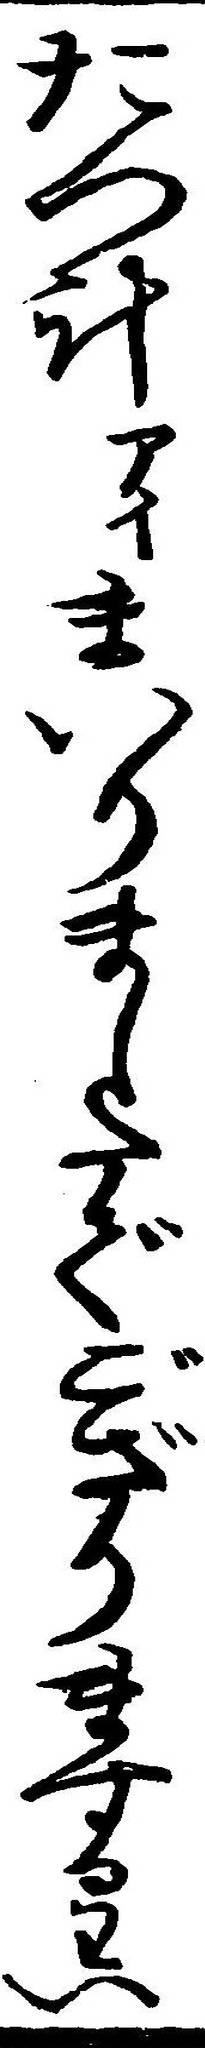たつ計アイまいりましたでござりまするわい
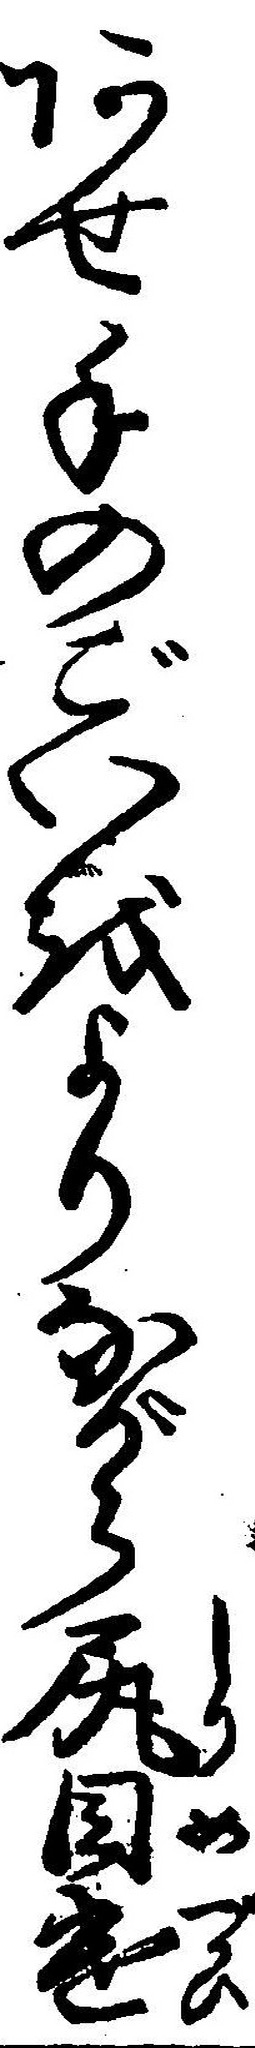あせ手のごいをよりながら尻目遣
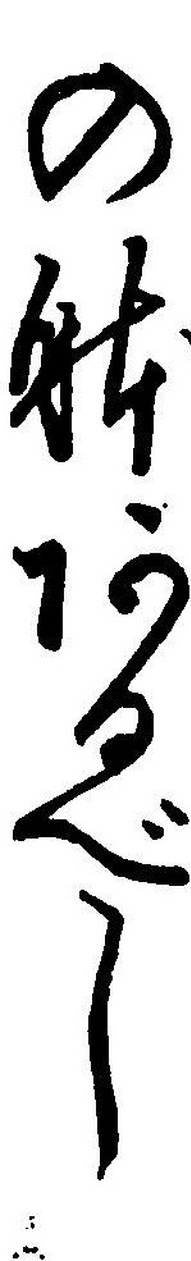の体なるべし

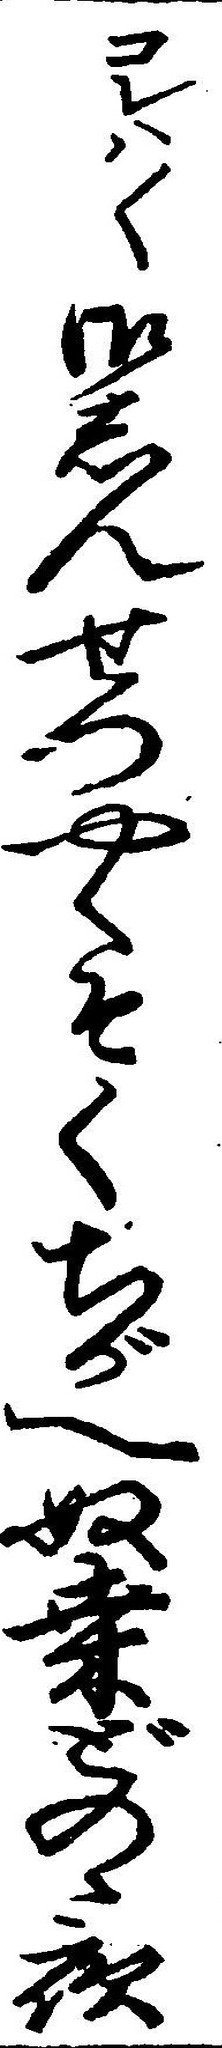コレハ〳〵御しんせつやくそくちがへぬ桑どのゝ夜
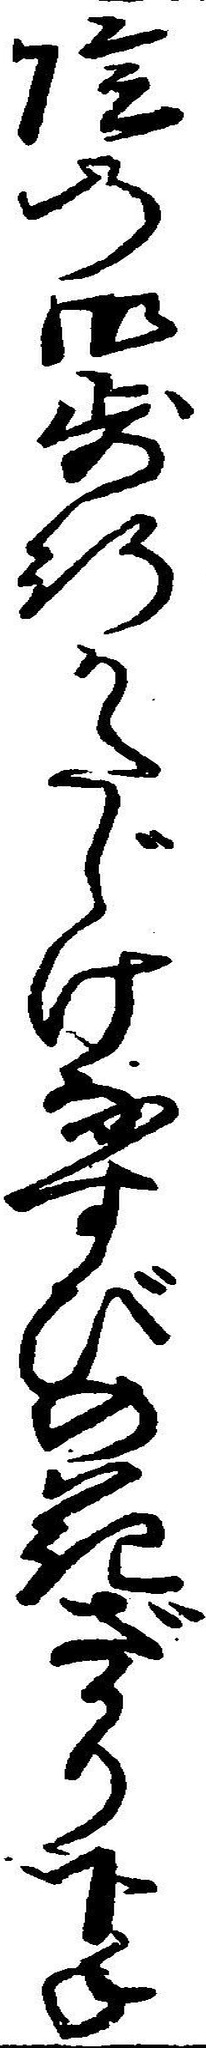陰の御歩行かたじけなすびの花ざかり下手
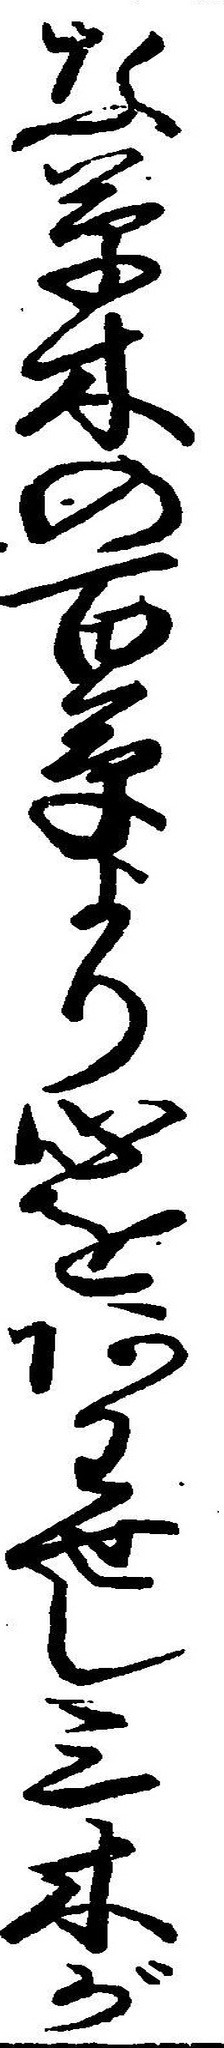な草木の百草より心をあわせし三木が
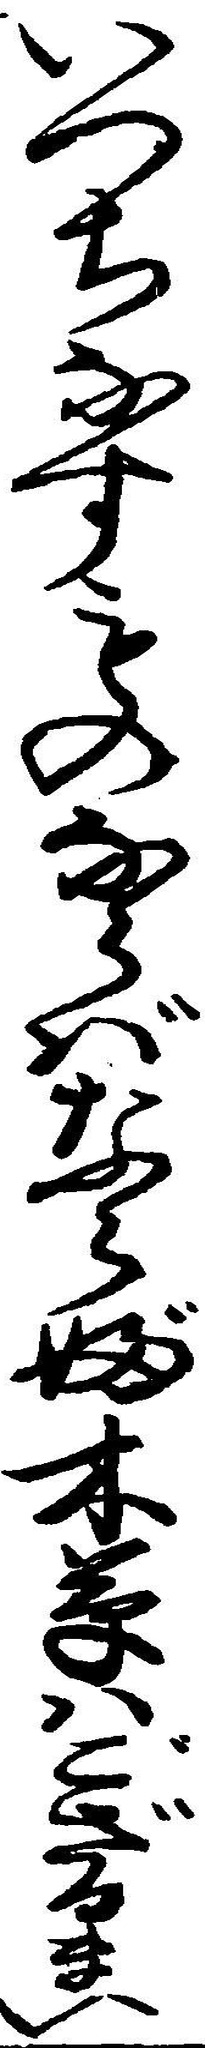いつちなすものならばならぶ木草はござるまい
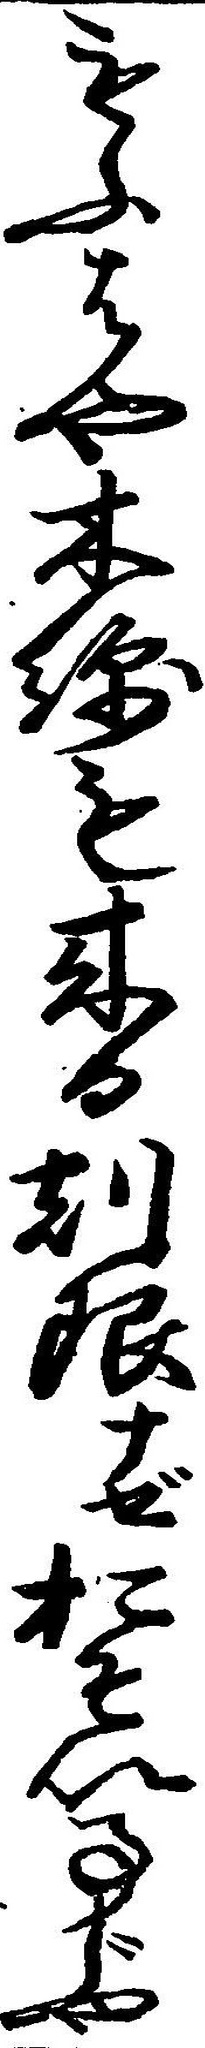もふはや木綿も来る刻限ナゼおそい事じや
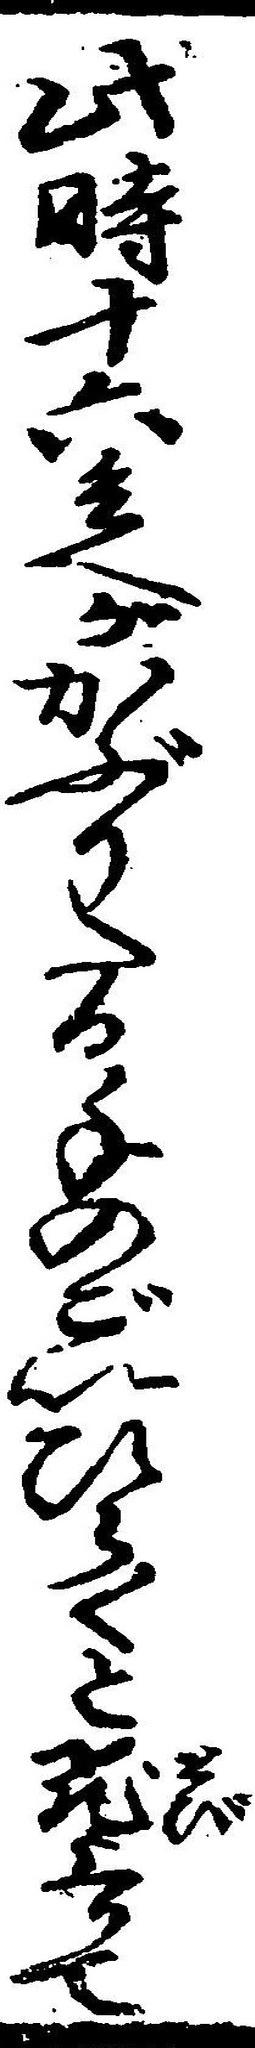此時中六兵衛がかぶりたる手のごいひら〳〵と飛上りて
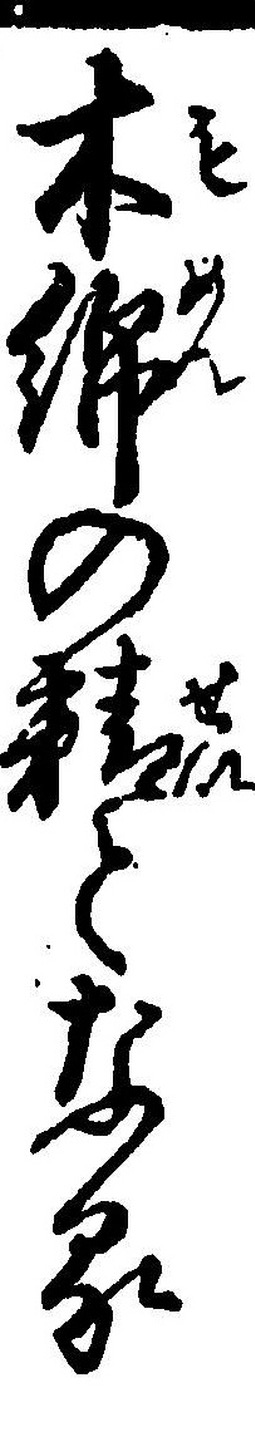木綿の精となる
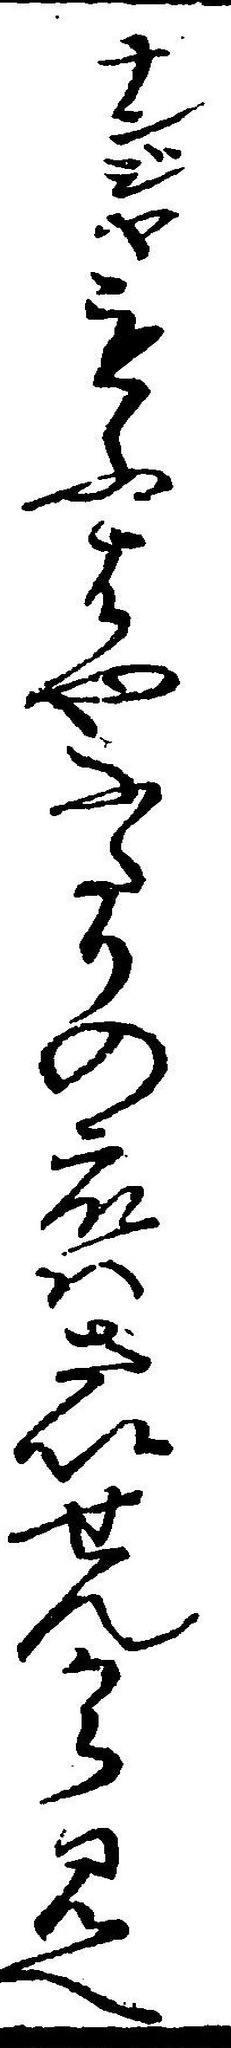ナンジヤもふはやふたりの衆はさいせんから見へ
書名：草木芝居化物退治 / 泉花堂三蝶(十六兵衛)作
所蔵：東京大学総合図書館 General Library in the University of Tokyo, JAPAN
